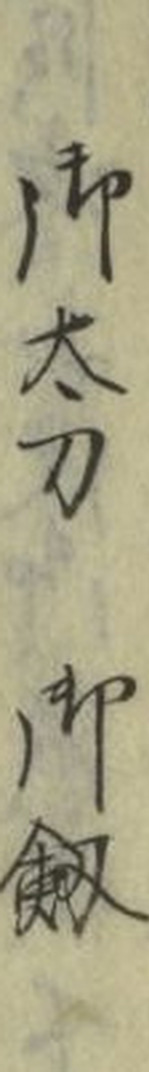御太刀御剣
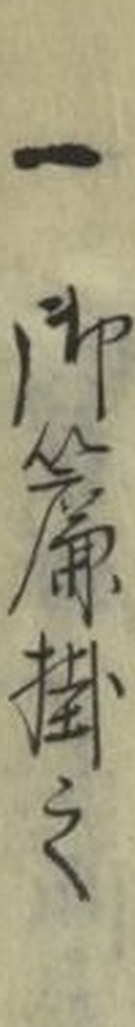一御簾掛之
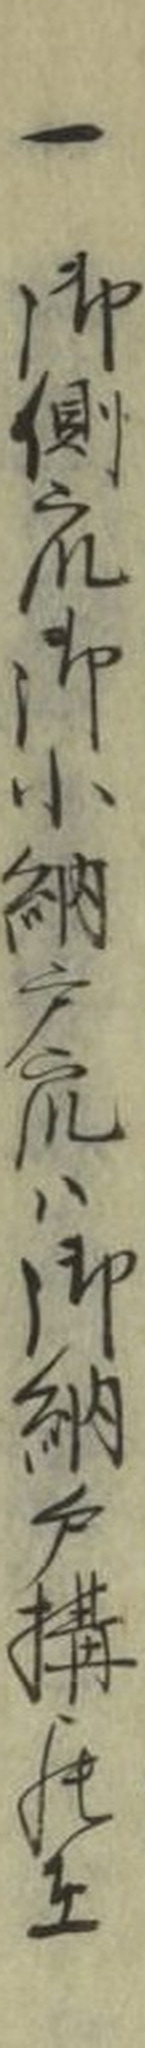一御側衆御小納戸衆は御納戸構罷在
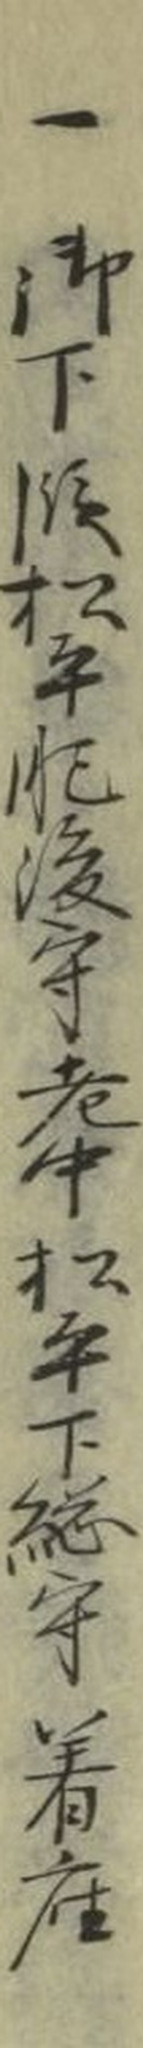一御下段松平肥後守老中松平下総守着座
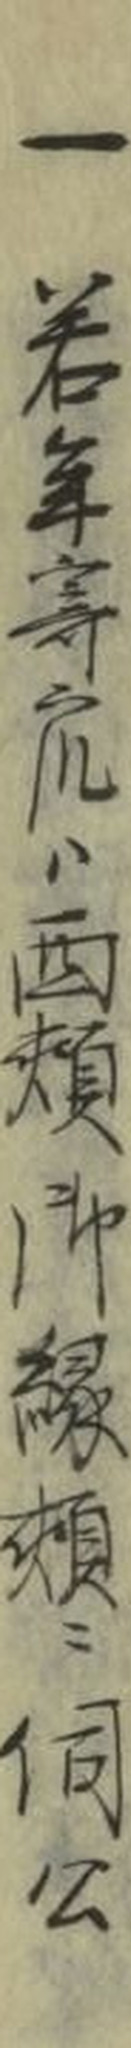一若年寄衆は西頬御縁頬に伺公
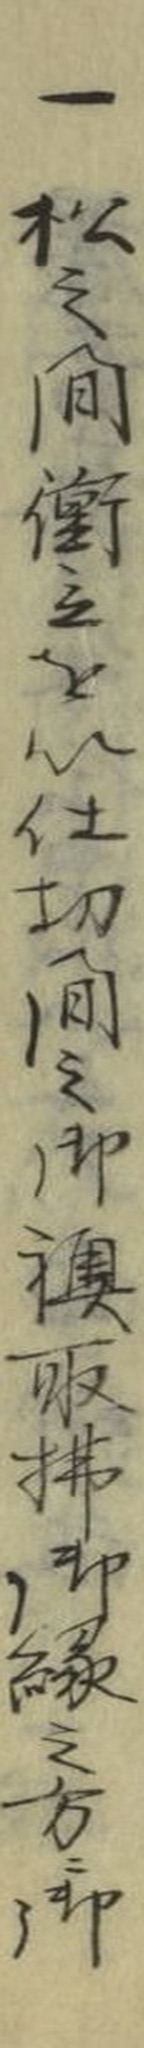一松之間衝立を以仕切間之御襖取払御縁之方に御

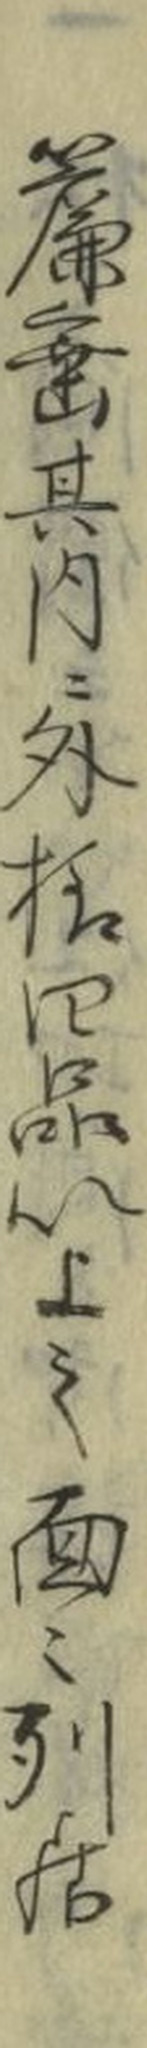簾垂其内に外様四品以上之面々列居
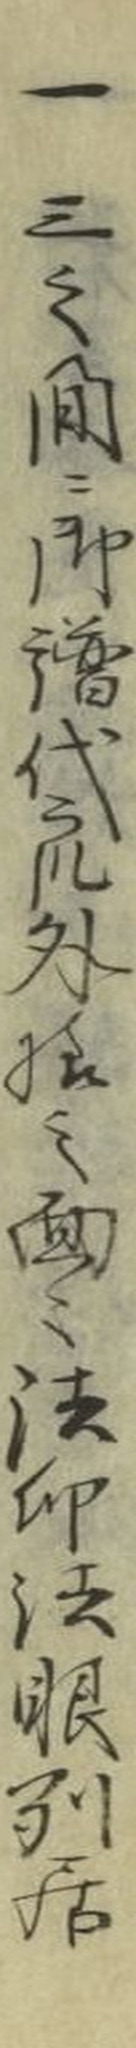一三之間に御譜代衆外様之面々法印法眼列居
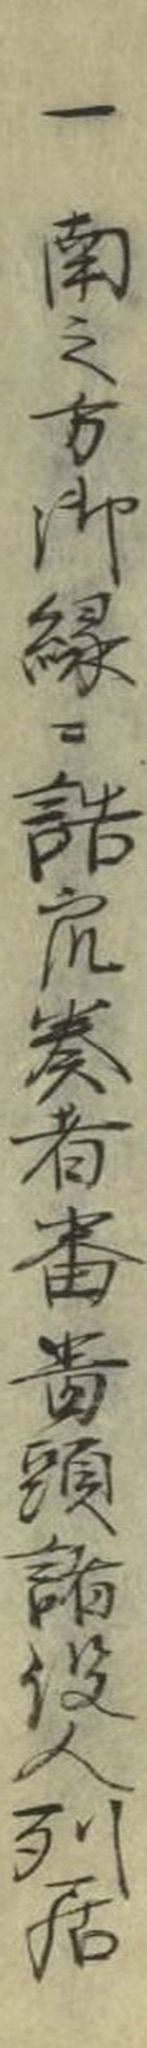一南之方御縁に詰衆奏者番番頭諸役人列居
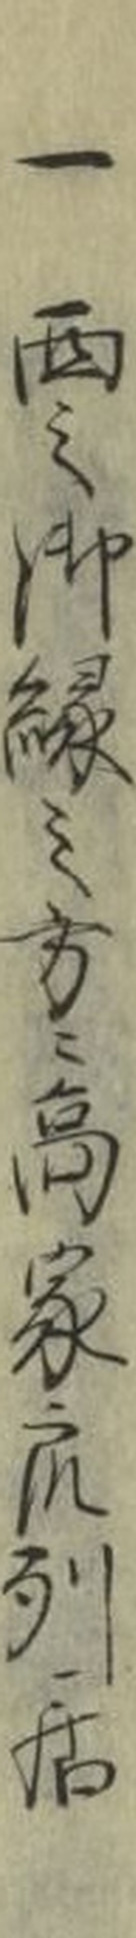一西之御縁之方に高家衆列居
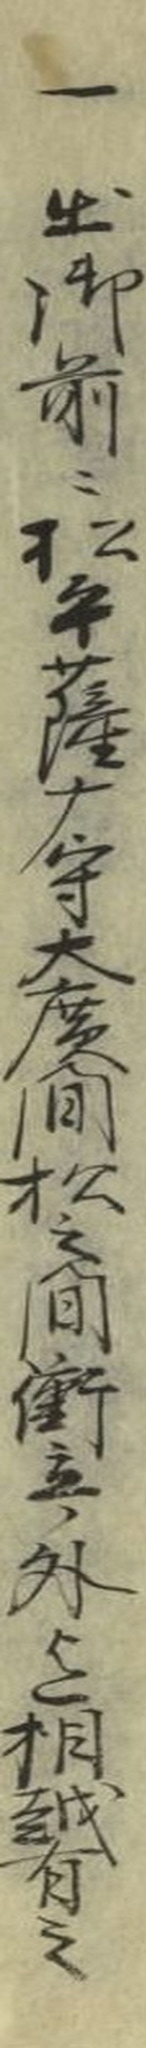一出御前に松平薩摩守大広間松之間衝立の外迄相越有之
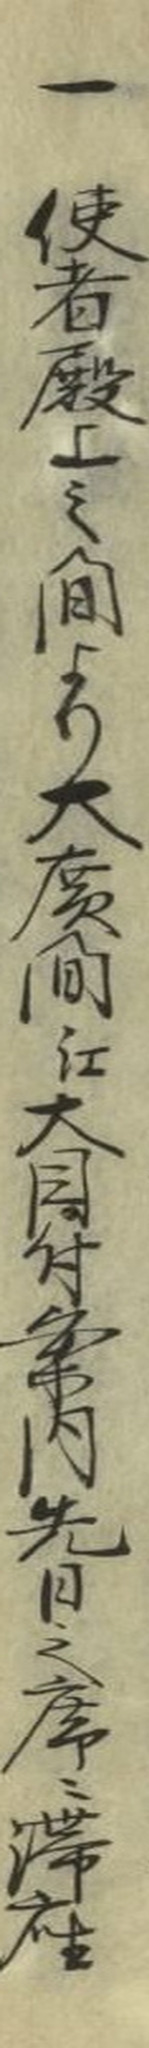一使者殿上之間より大広間え大目付案内先日之席に滞座
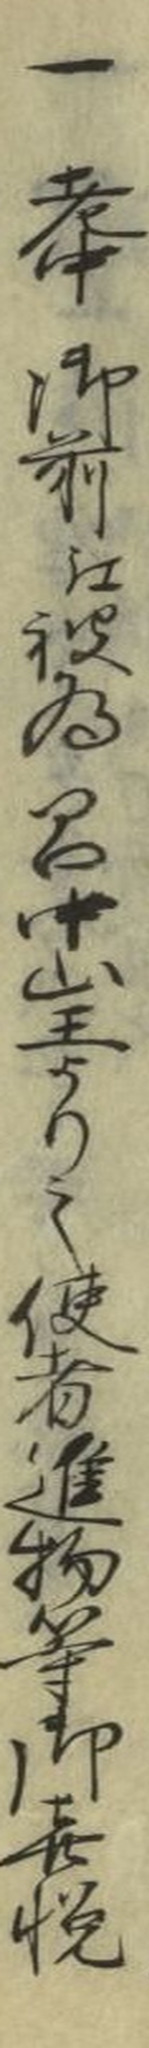一老中御前え被為召中山王より之使者進物等御喜悦
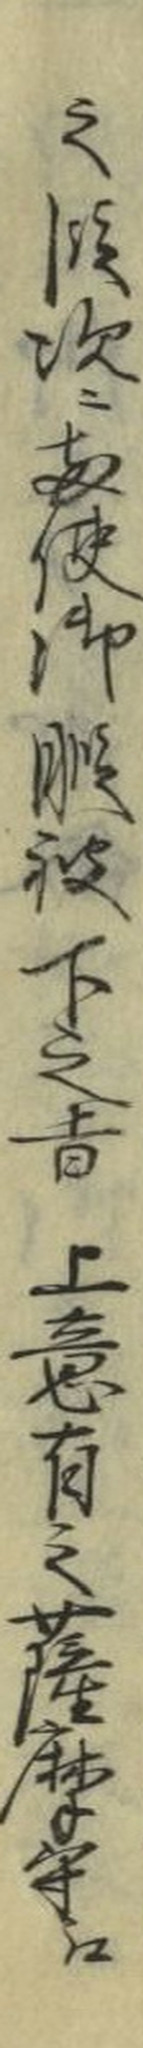之段次に両使御暇被下之旨上意有之薩摩守え
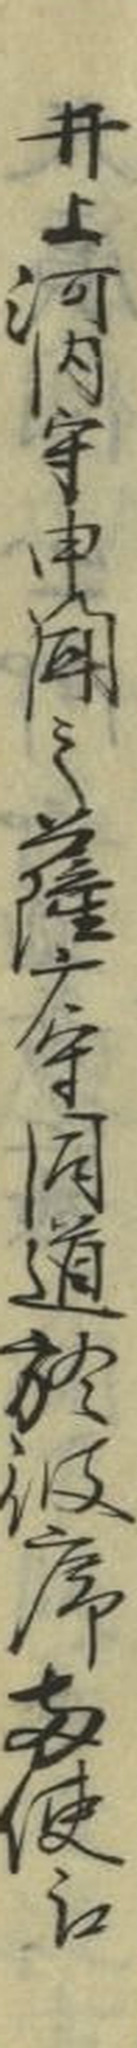井上河内守申聞之薩摩守同道於彼席両使え
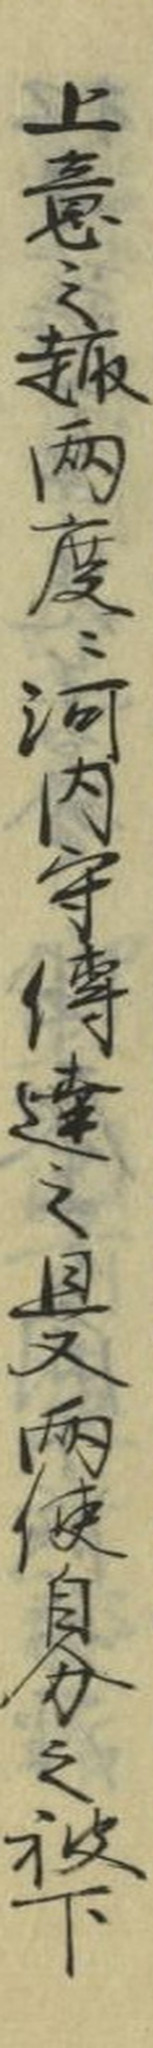上意之趣両度に河内守伝達之且又両使自分之被下
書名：宝永七庚寅年琉球国来聘使日記
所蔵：University of the Ryukyus Library
